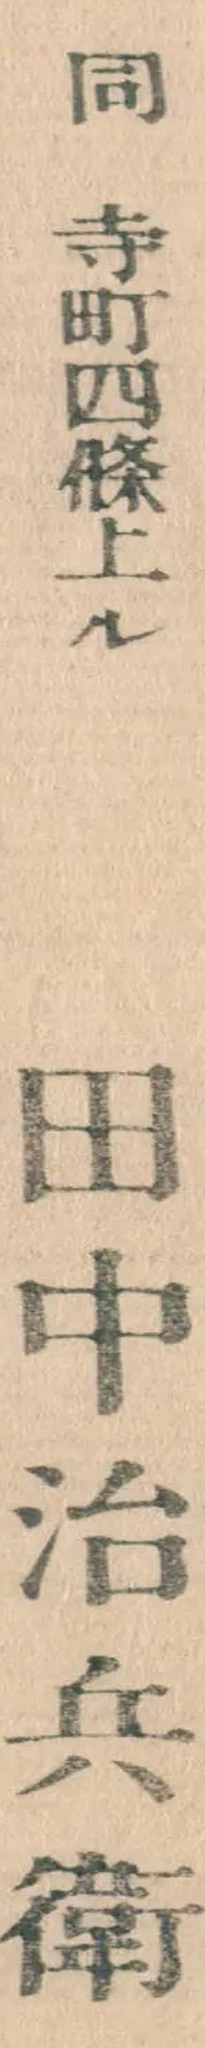同寺町四条上ル田中治兵衛
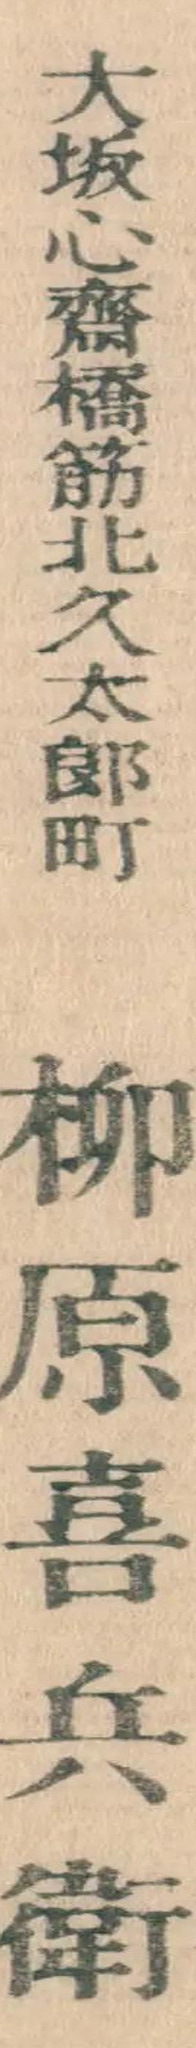大坂心斎橋筋北久太郎町柳原喜兵衛
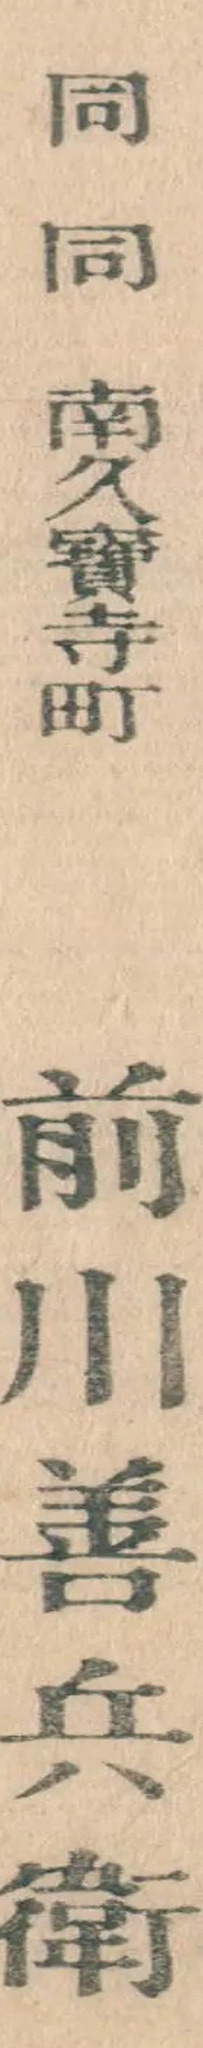同同南久宝寺町前川善兵衛
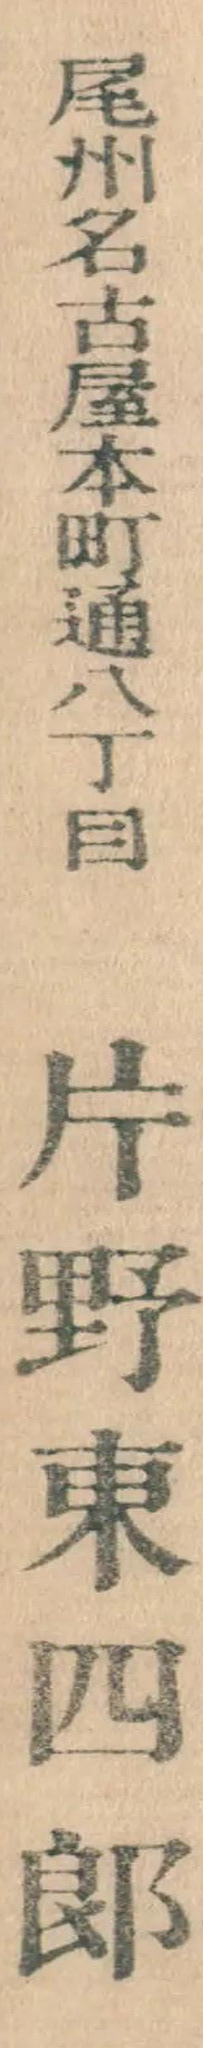尾州名古屋本町通八丁目片野東四郎
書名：有毒草木図説 2巻. [2]
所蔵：国立国会図書館 National Diet Library, JAPAN
